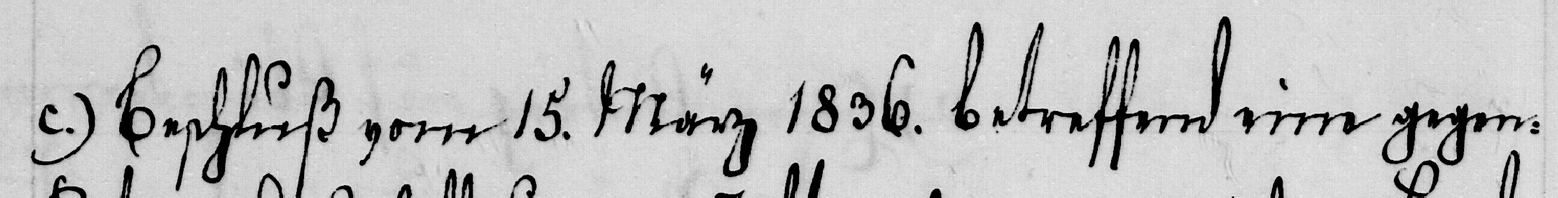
c.) Beschluß vom 15. März 1836. betreffend eine gegen¬
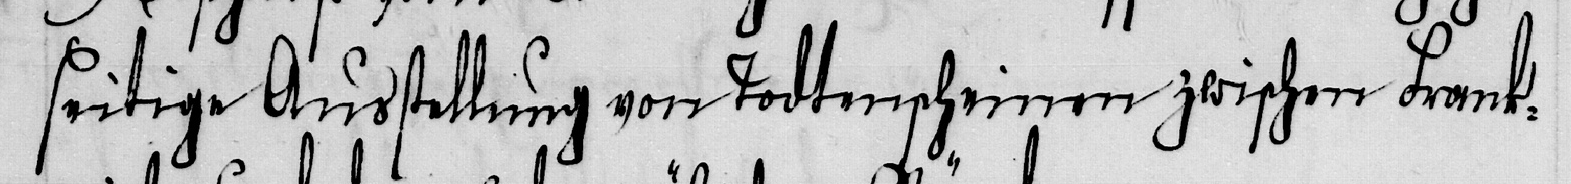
seitige Ausstellung von Todtenscheinen zwischen Frank¬
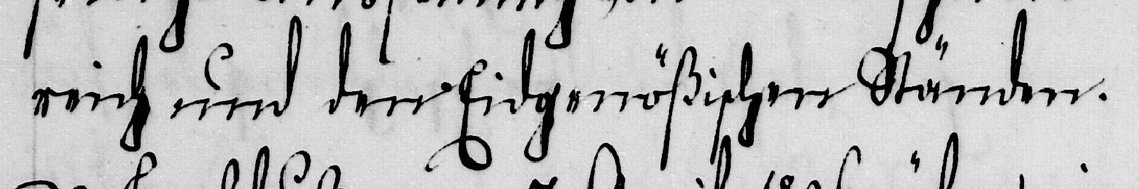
reich und den Eidgenößischen Ständen.
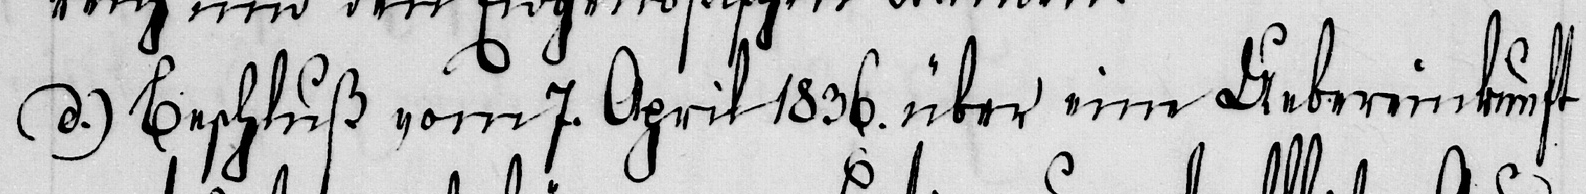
d.) Beschluß vom 7. April 1836. über eine Uebereinkunft
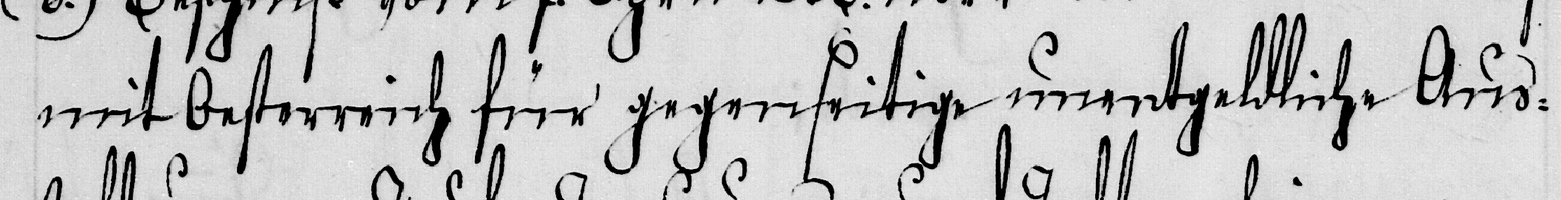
mit Oesterreich für gegenseitige unentgeldliche Aus¬
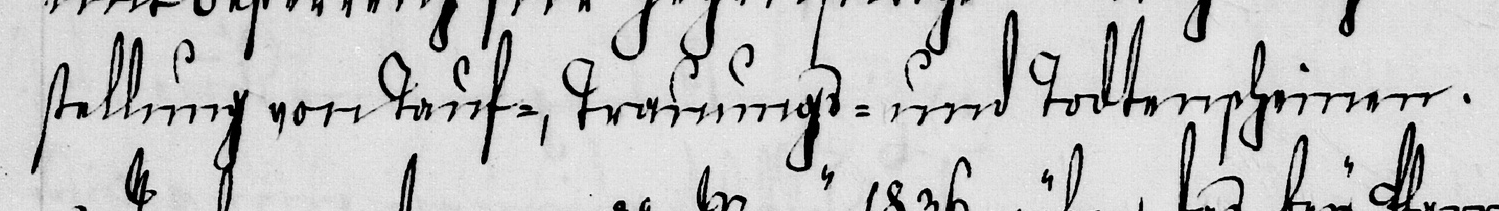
stellung von Tauf-, Trauungs- und Todtenscheinen.
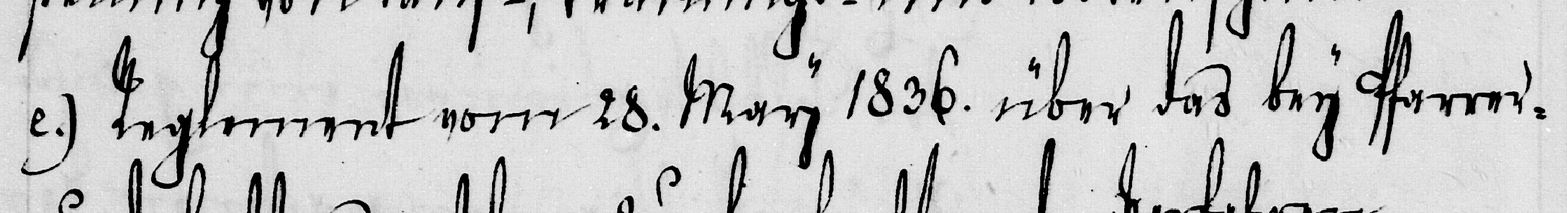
e.) Reglement vom 28. May 1836. über das bey Pfarrer-
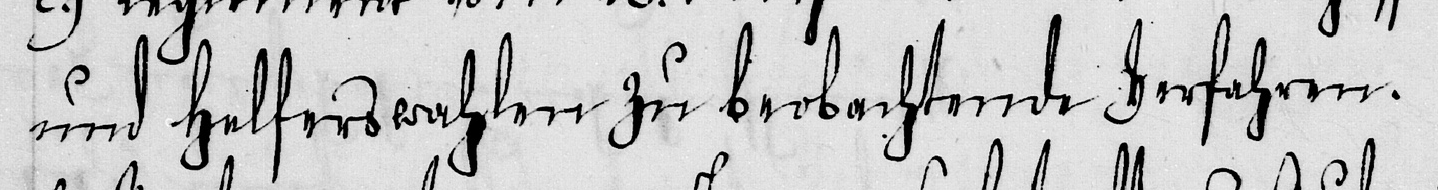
und Helferswahlen zu beobachtende Verfahren.
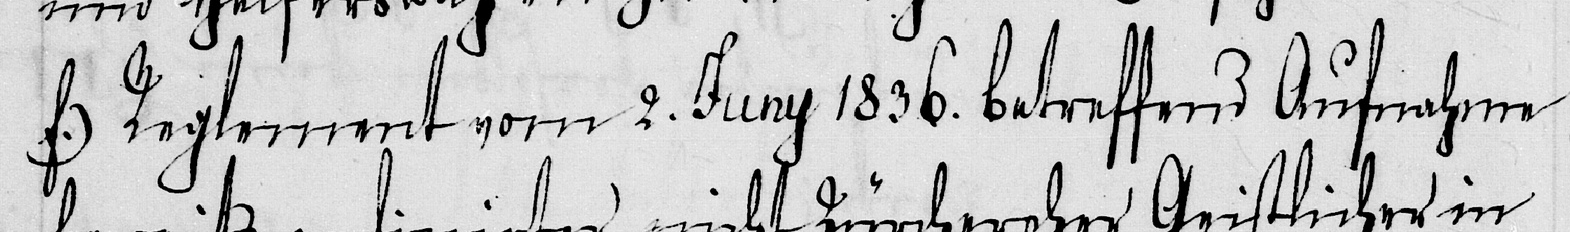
f.) Reglement vom 2. Juny 1836. betreffend Aufnahme
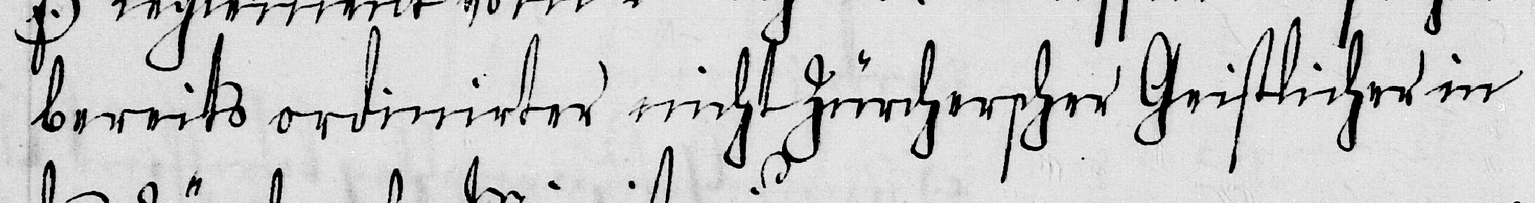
bereits ordinirter nicht Zürcherscher Geistlicher in
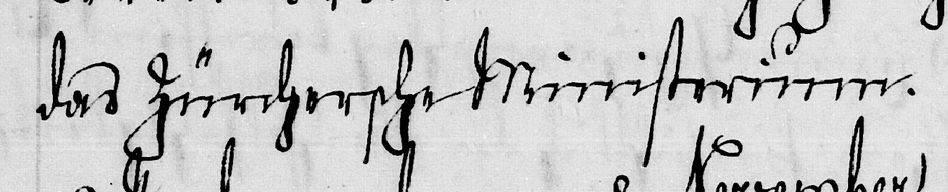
das Zürchersche Ministerium.
